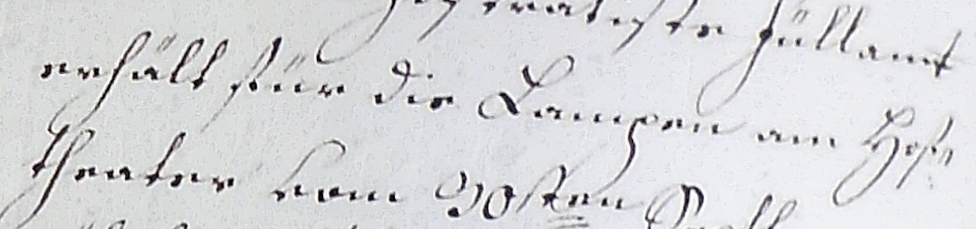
erhält für die Lampen am Hof¬
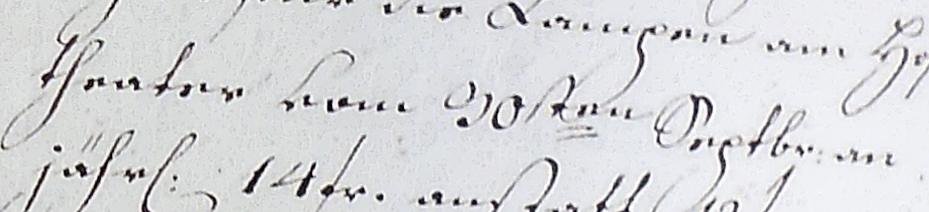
theater vom 30ste͇n Septbr: an
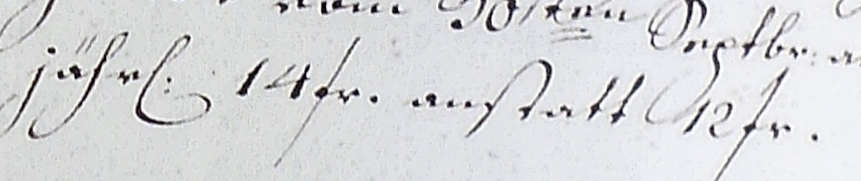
jährl: 14fr. anstatt 12fr.
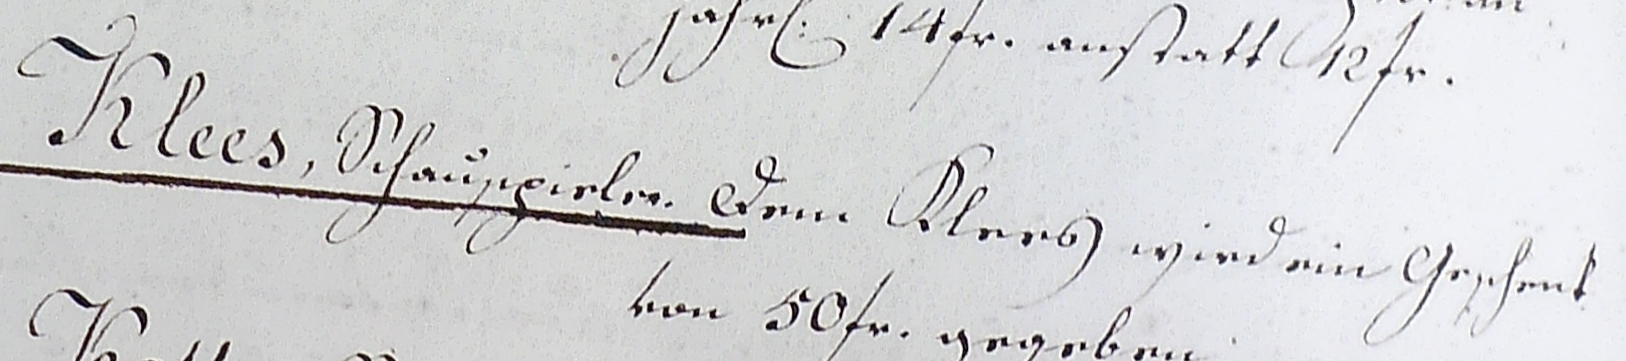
Klees, Schauspieler. Dem Klees wird ein Geschenk
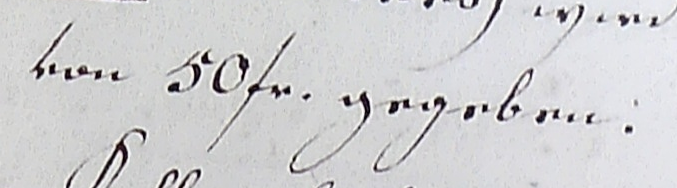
von 50fr. gegeben.
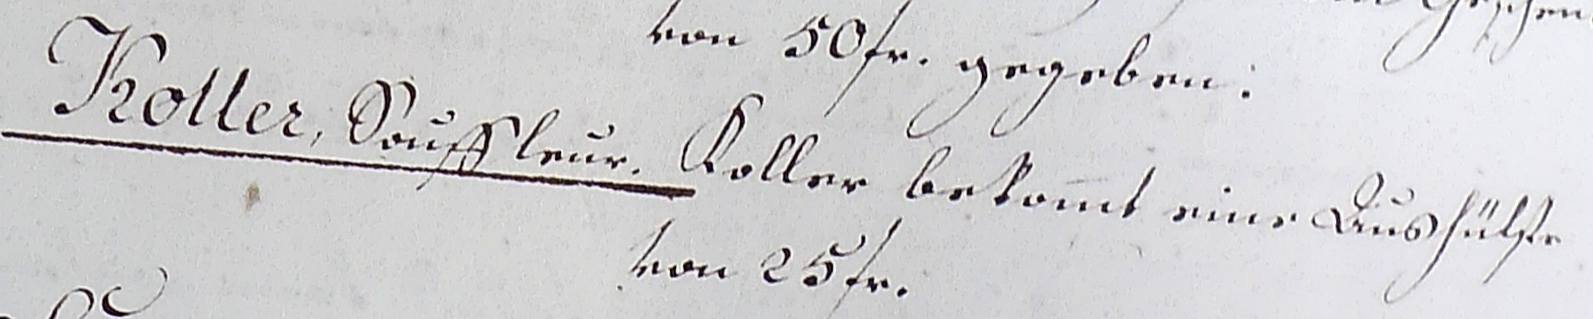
Koller, Souffleur. Koller bekom̅t eine Aushülfe
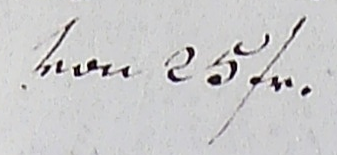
von 25fr.
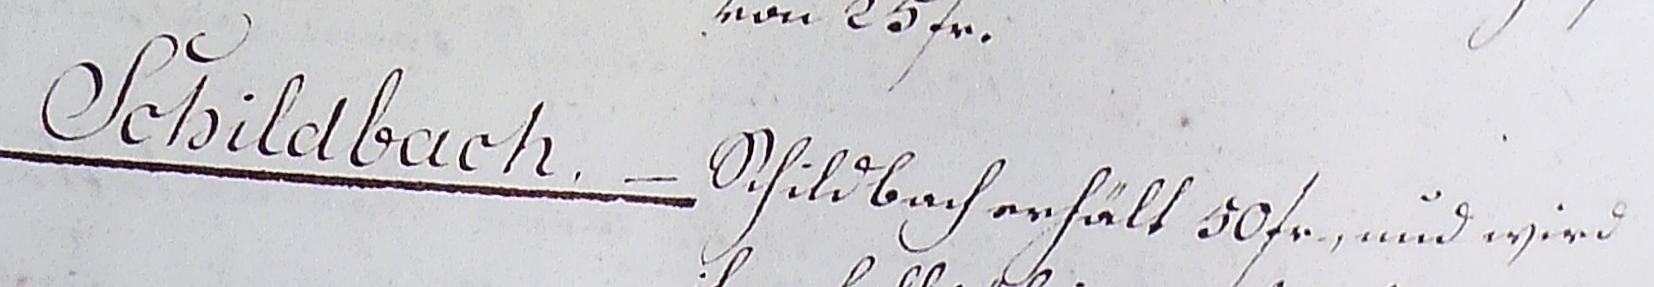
Schildbach. .. Schildbach erhält 50fr. und wird
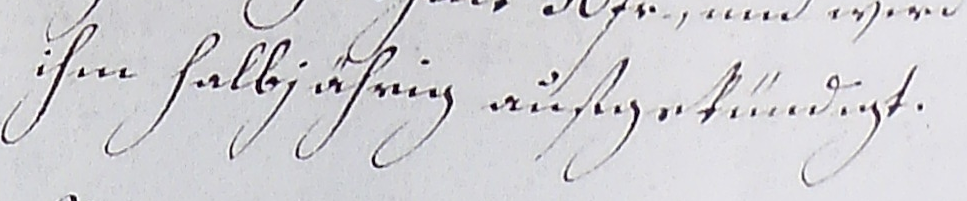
ihm halbjährig aufgekündigt.
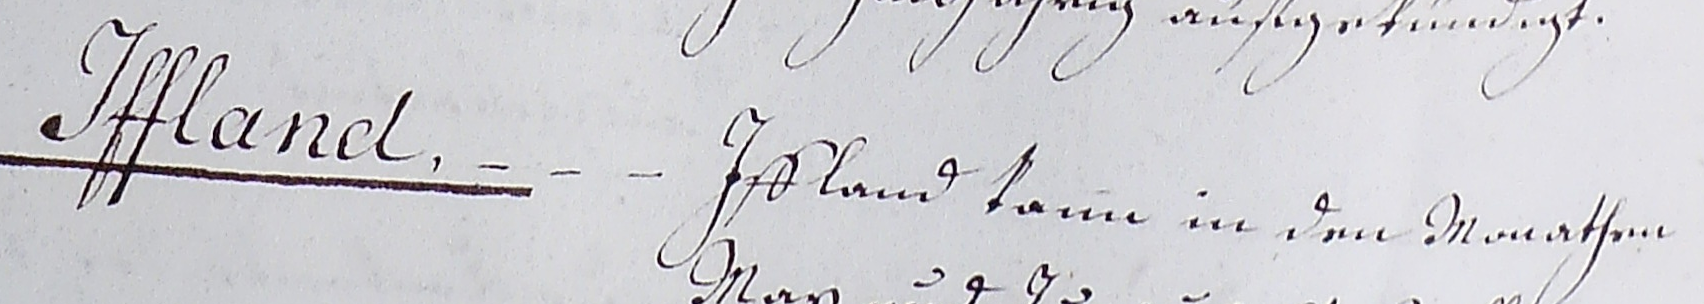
Iffland. .. .. .. Iffland kann in den Monathen
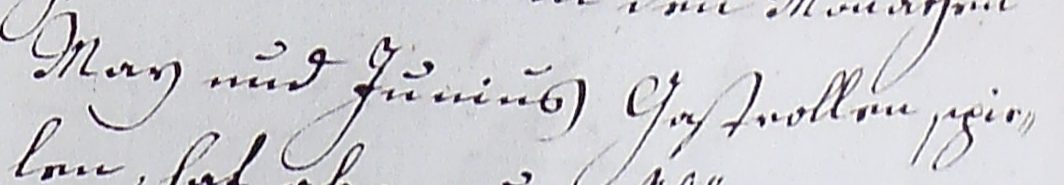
May und Junius Gastrollen spie¬
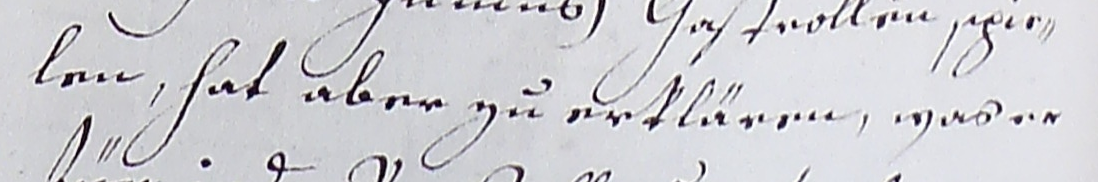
len, hat aber zu erklären, was er
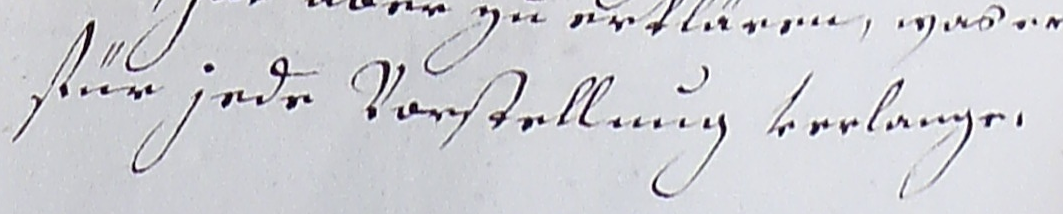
für jede Vorstellung verlange.
